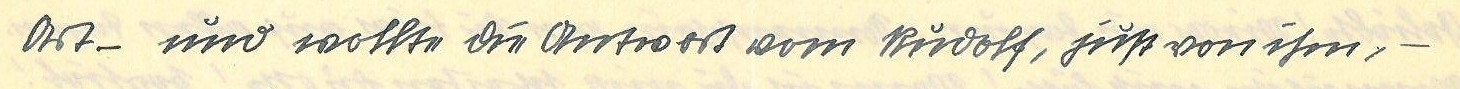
Art – und wollte die Antwort von, just von ihm, –
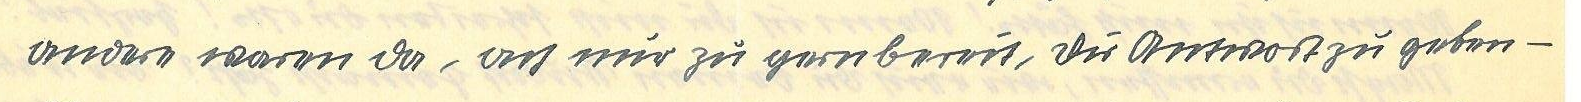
andere waren da, ach nur zu gern bereit, die Antwort zu geben –
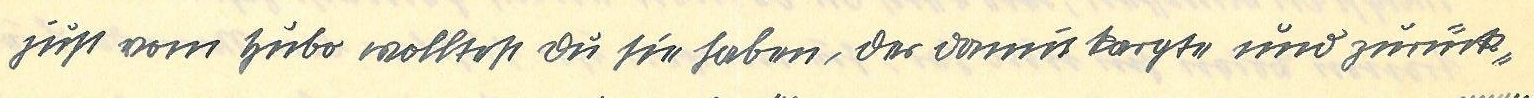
just vom Hubo wolltest Du sie haben, der damit kargte und zurück¬
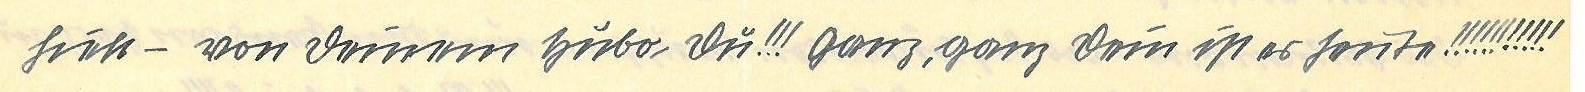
hielt – von Deinem Hubo, Du!!! Ganz, ganz Dein ist er heute!!!!!!!!!!!
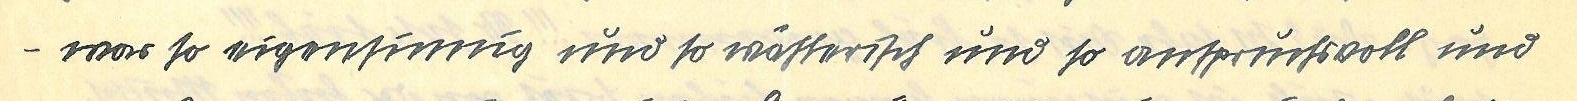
– war so eigensinnig und so wählerisch und so anspruchsvoll und
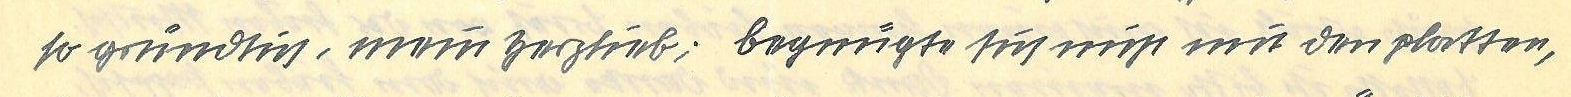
so gründlich, mein Herzlieb; begnügte sich nicht mit den platten,
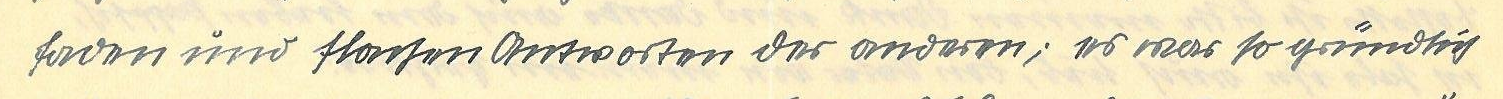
faden und flachen Antworten der anderen; es war so gründlich
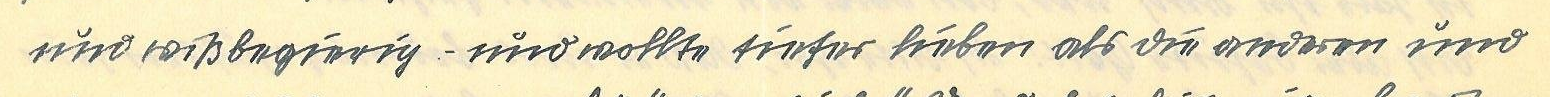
und wißbegierig – und wollte tiefer lieben als die anderen und
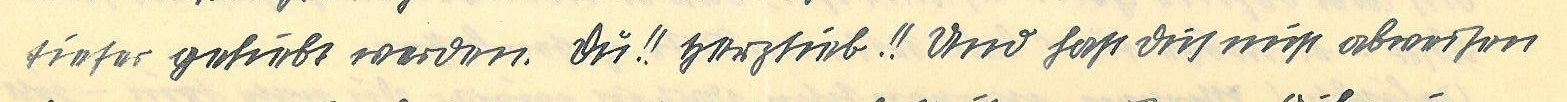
tiefer geliebt werden. Du!! Herzlieb!! Und hast Dich nicht abweisen
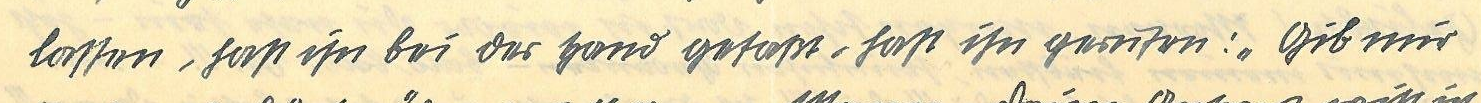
lassen, hast ihn bei der Hand gefaßt, hast ihn gerufen: „Gib mir
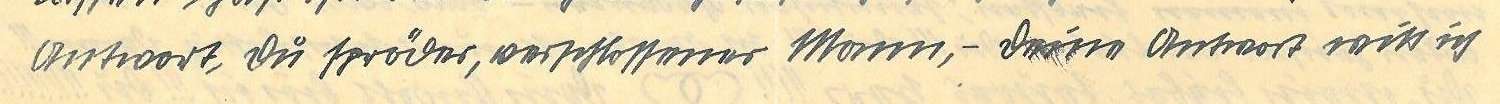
Antwort, Du spröder, verschlossener Mann, – Deine Antwort will ich
